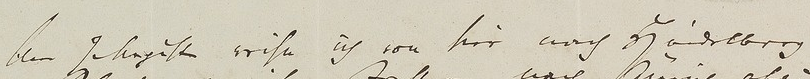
Am 7. August reise ich von hier nach Heidelberg
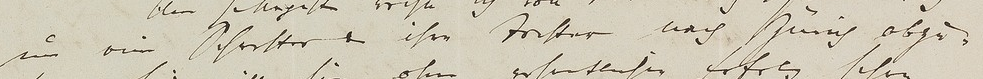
um eine Schwester & ihre Tochter nach Zürich abzu-
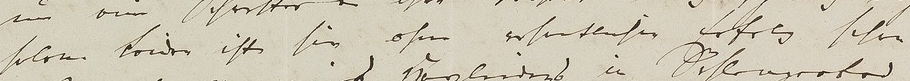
holen. Leider ist sie ohne wesentlichen Erfolg schon
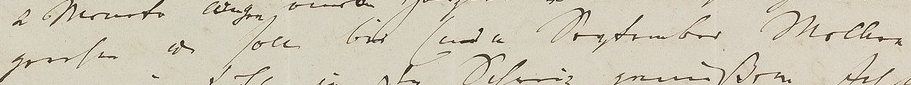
gewesen u. soll bis Ende September Molken
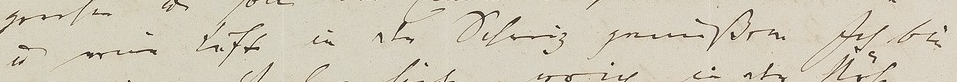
u reine Luft in der Schweiz genießen. Ich bin
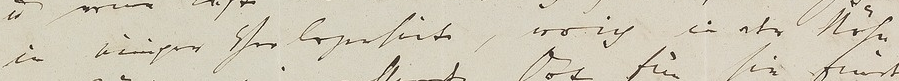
in einiger Verlegenheit, wo ich in der Nähe
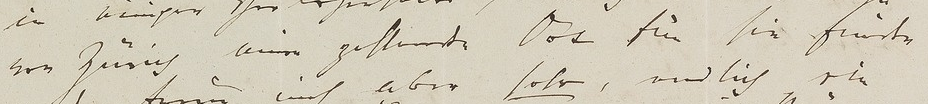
von Zürich einen passenden Ort für sie finden
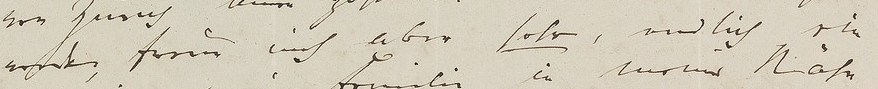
werde, freue mich aber sehr, endlich ein
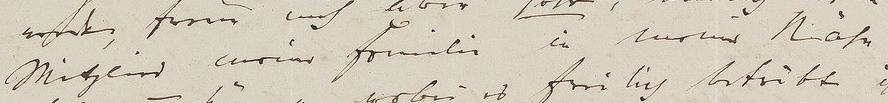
Mitglied meiner Familie in meiner Nähe
